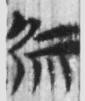𫵖
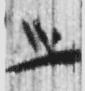之
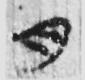月
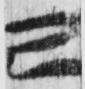己
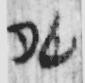卯
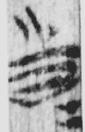之日
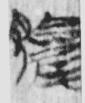觀
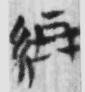綳
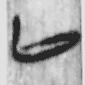㠯（以）
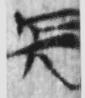長
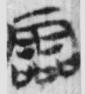霝（靈）
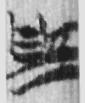爲
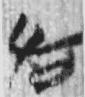左
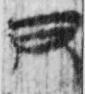尹
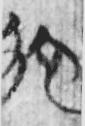{力它}
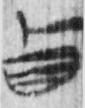貞
